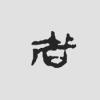尙
